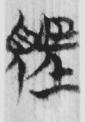{見望}
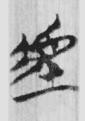𫊟
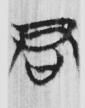君
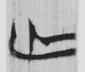亡
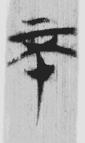不
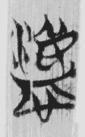溋
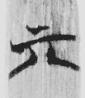亓（其）
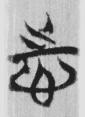志
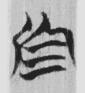於
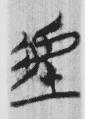𫊟
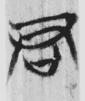君
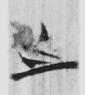之
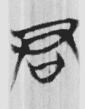君
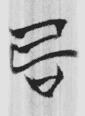{己口}
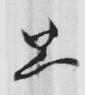也
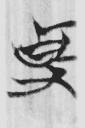史
